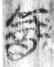酓（飲）
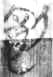○（食）
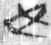女（如）
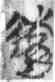遠
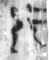行
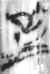剉
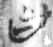曰
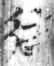居
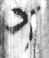又（有）
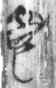○（食）
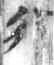行
